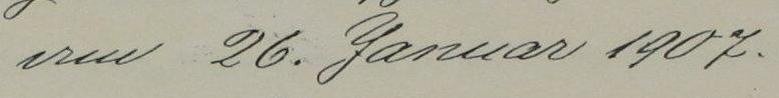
am 26. Januar 1907.
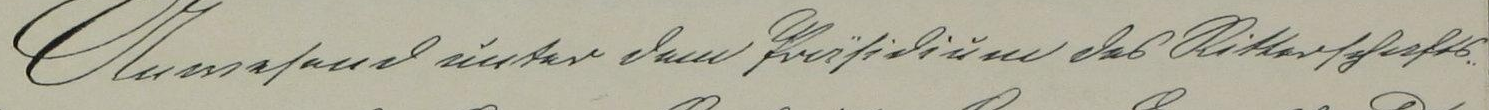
Anwesend unter dem Präsidium des Ritterschafts-
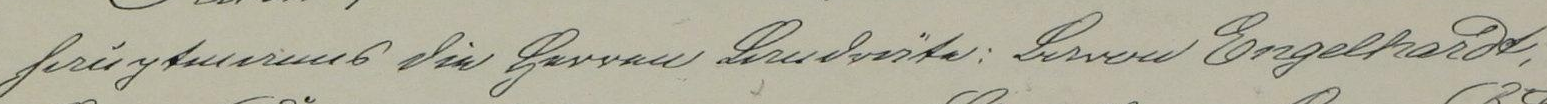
hauptmanns die Herren Landräte: Baron Engelhardt,
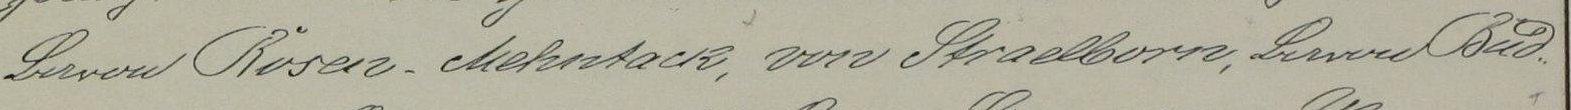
Baron Rosen-Mehntack, von Straelborn, Baron Bud-
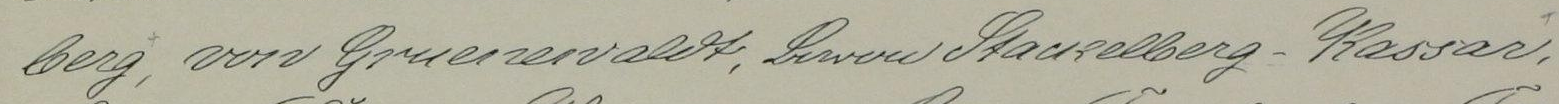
berg, von Gruenewaldt, Baron Stackelberg-Kassar,
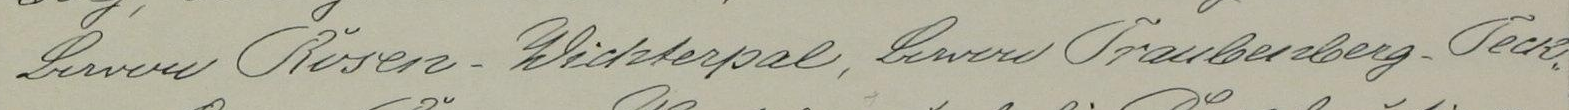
Baron Rosen-Wichterpal, Baron Traubenberg-Teck-
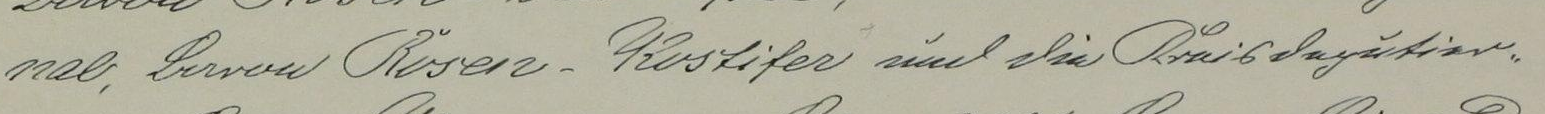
nal, Baron Rosen-Kostifer und die Kreisdeputier-
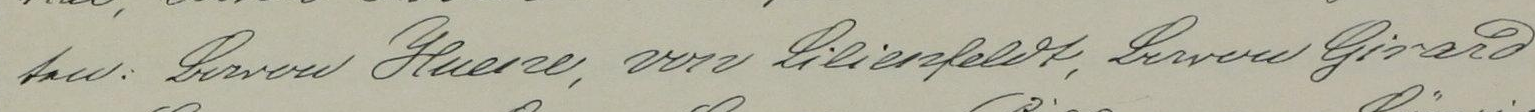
ten: Baron Huene, von Lilienfeldt, Baron Girard
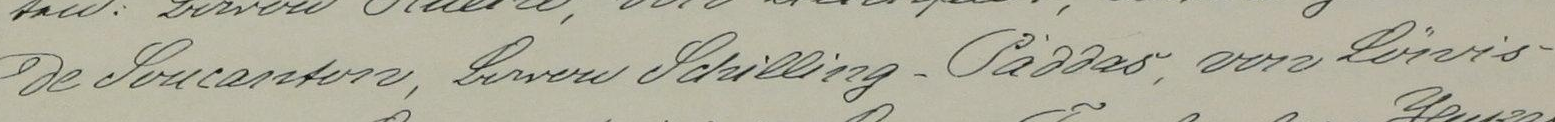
de Soucanton, Baron Schilling-Paddas, von Löwis
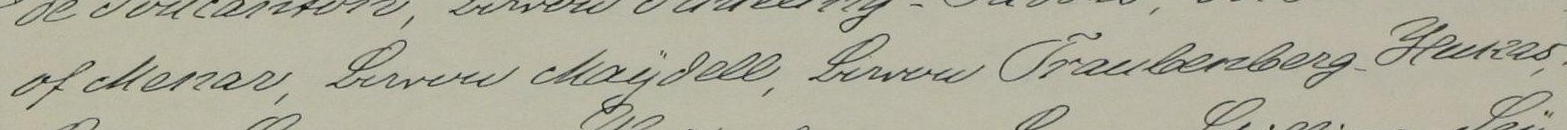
of Menar, Baron Maydell, Baron Traubenberg-Hukas,
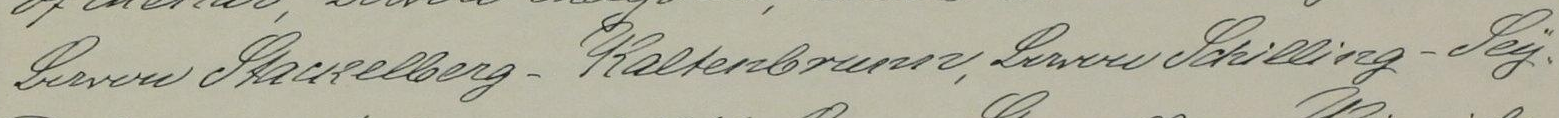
Baron Stackelberg-Kaltenbrunn, Baron Schilling-Sey-
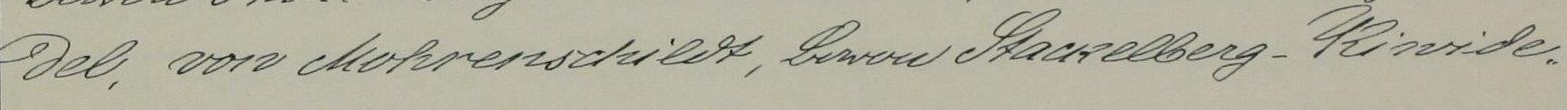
del, von Mohrenschildt, Baron Stackelberg-Kiwide-
